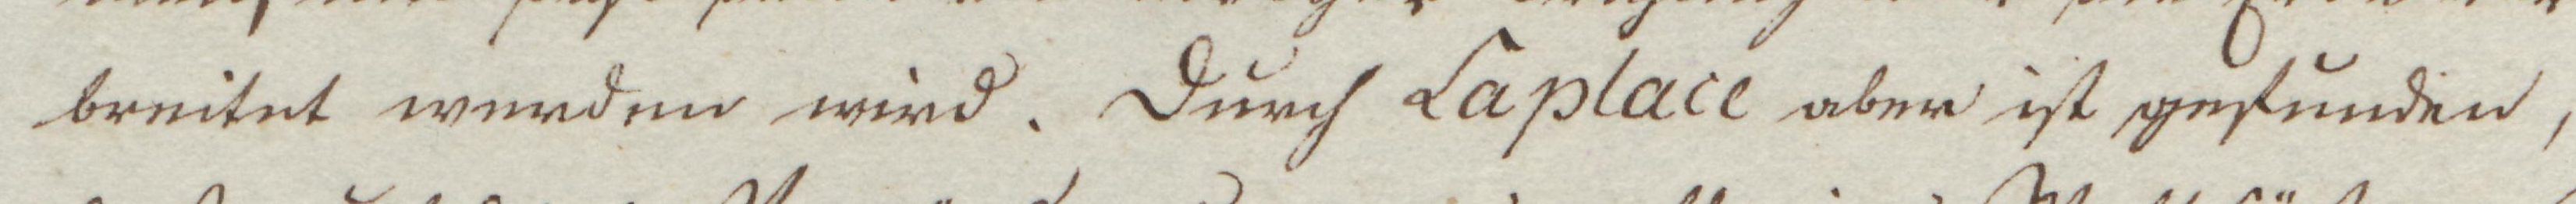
breitet werden wird. Durch Laplace aber ist gefunden,
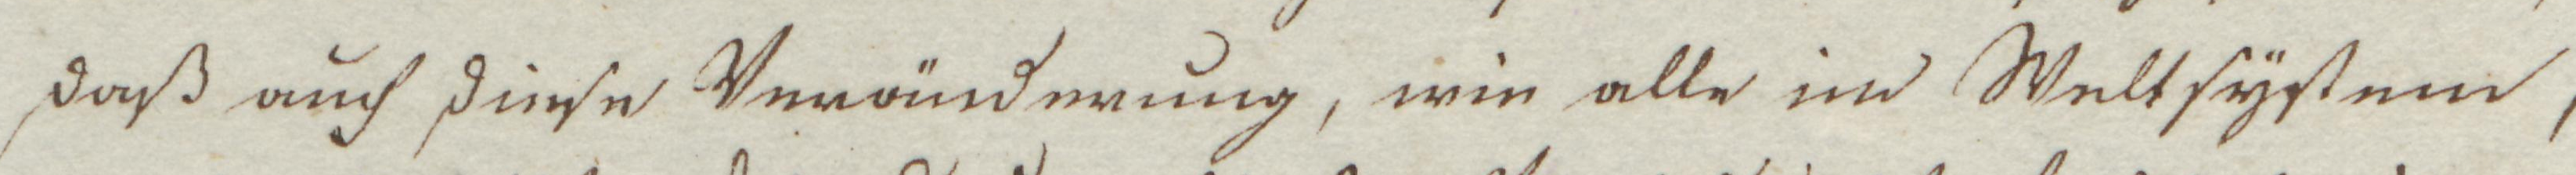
daß auch diese Veränderung, wie alle im Weltsÿstem,
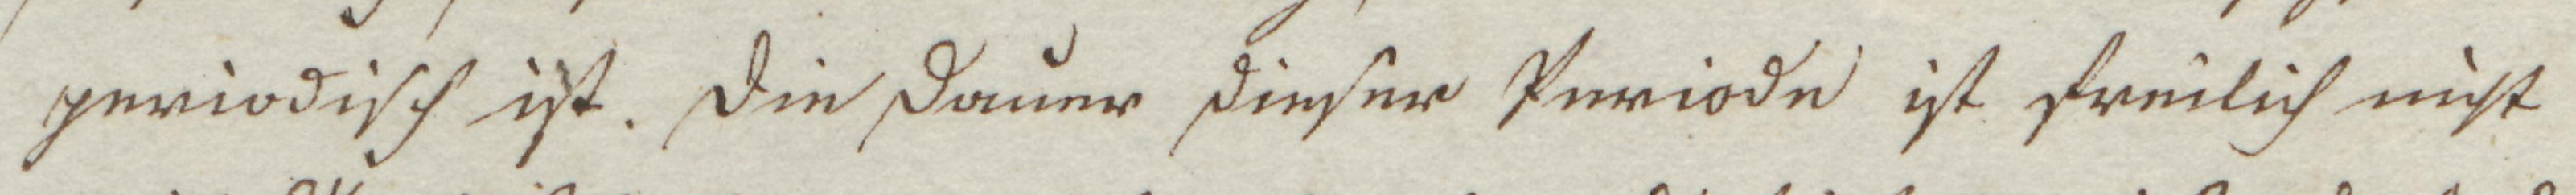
periodisch ist. Die Dauer dieser Periode ist freilich nicht
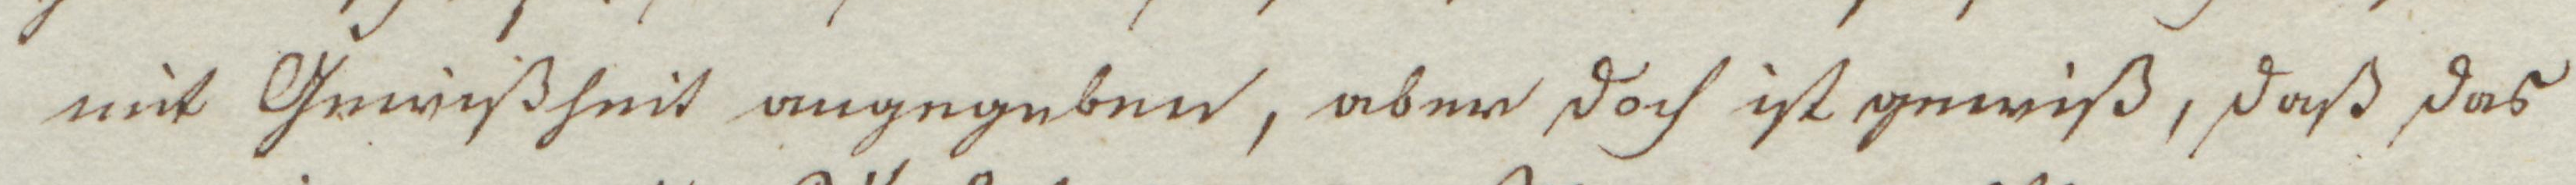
mit Gewißheit angegeben, aber doch ist gewiß, daß das
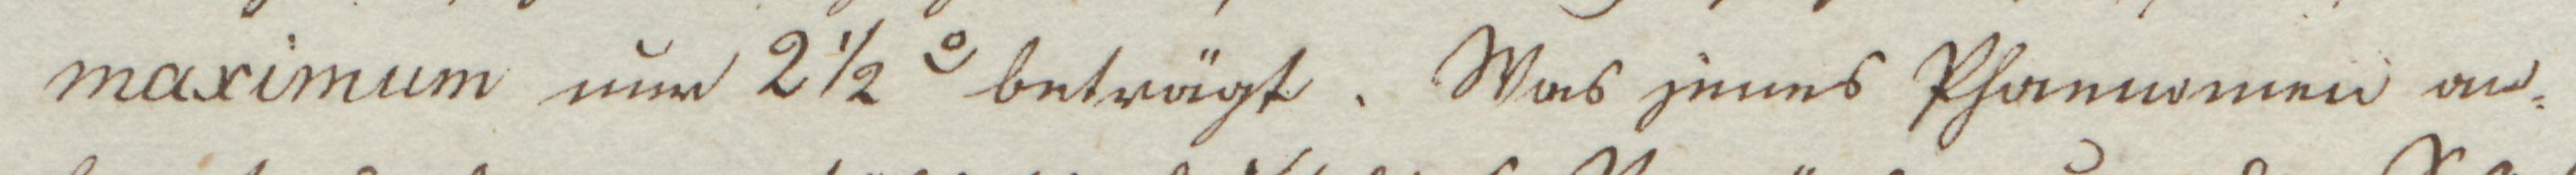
maximum nur 2½° beträgt. Was jenes Phaenomen an-
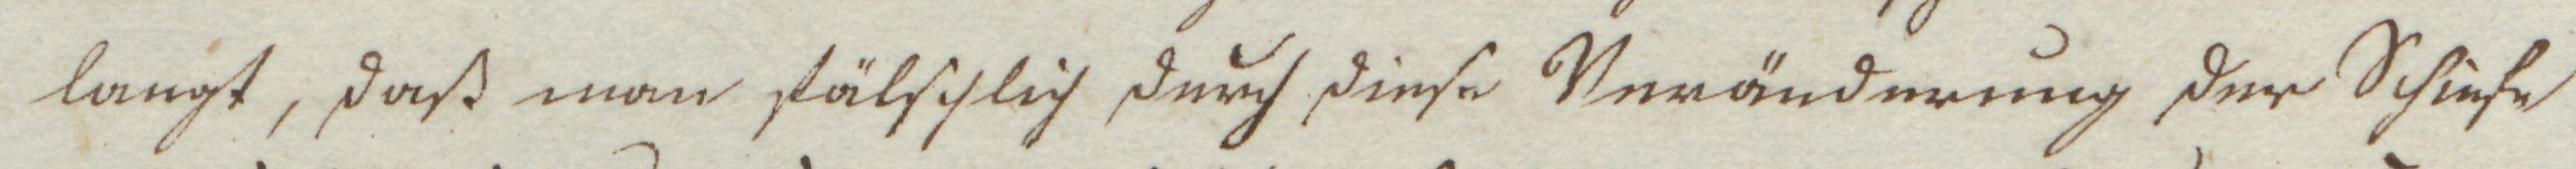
langt, daß man fälschlich durch diese Veränderung der Schiefe
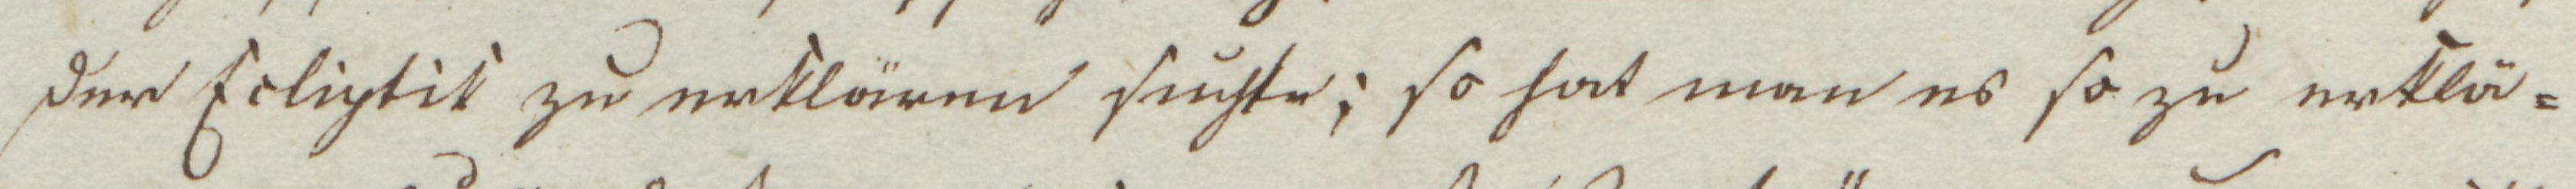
der Ecliptik zu erklären suchte; so hat man es so zu erklä-
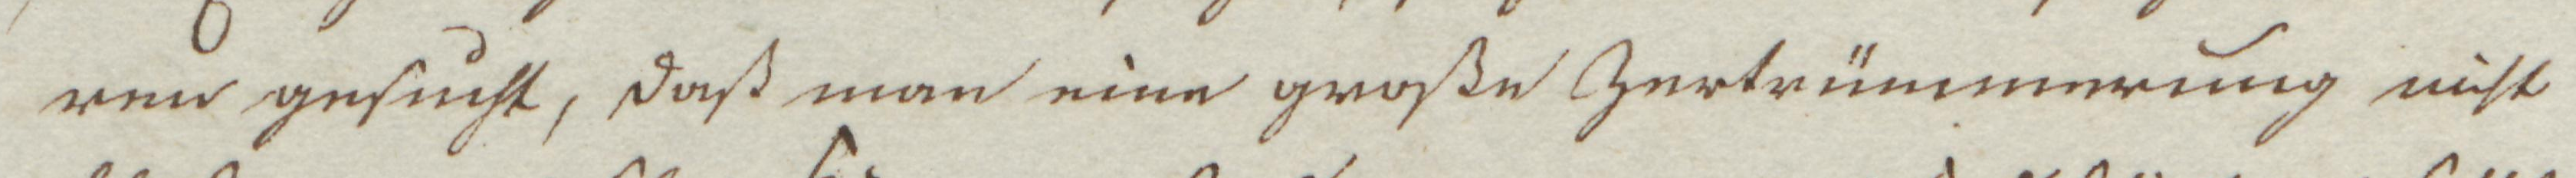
ren gesucht, daß man eine große Zertrümmerung nicht
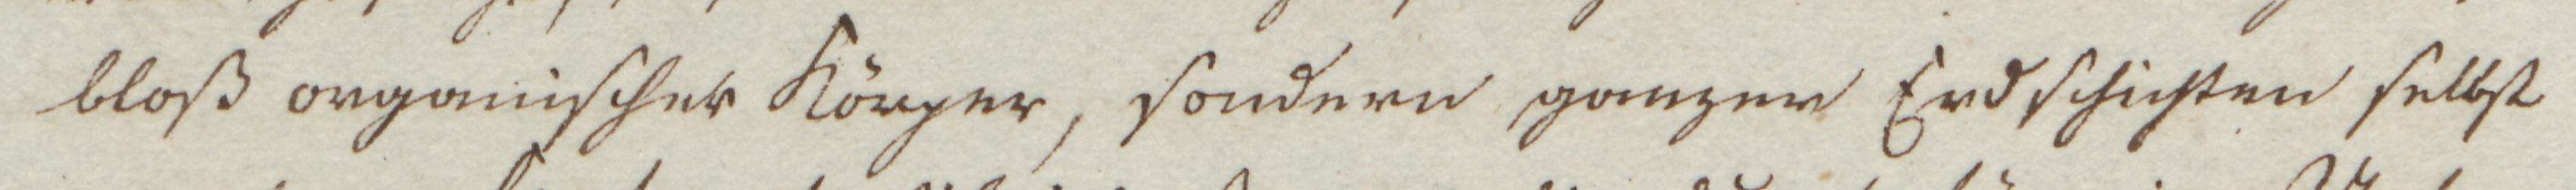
bloß organischer Körper, sondern ganzer Erdschichten selbst
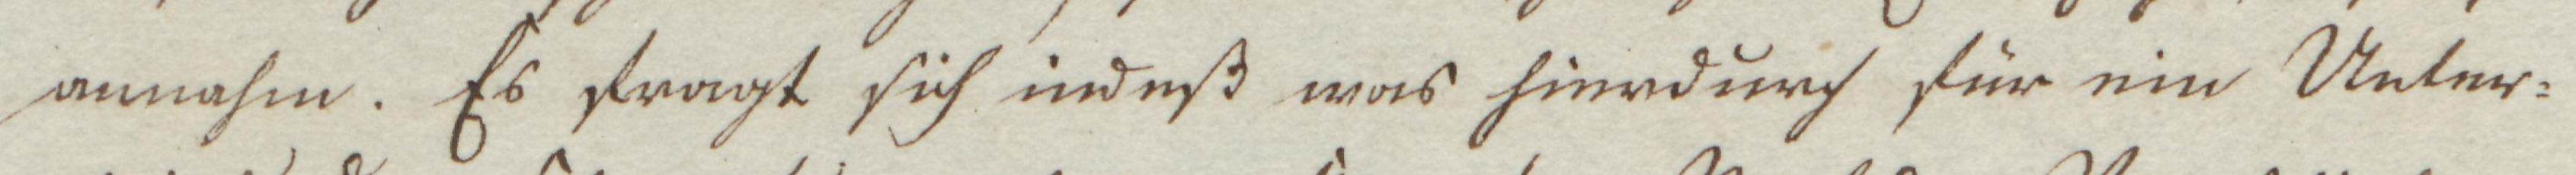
annahm. Es fragt sich indeß was hierdurch für ein Unter-
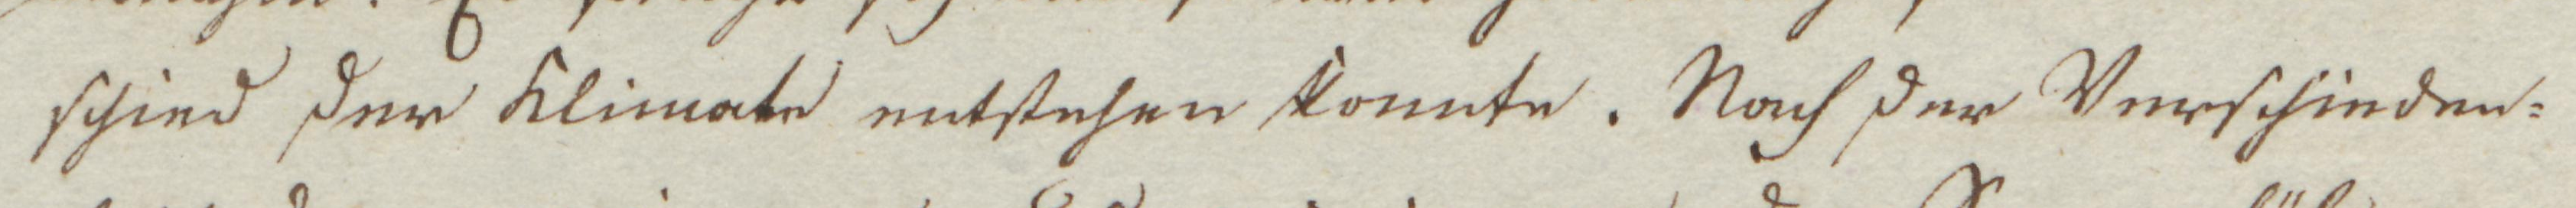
schied der Klimate entstehen konnte. Nach der Verschieden-
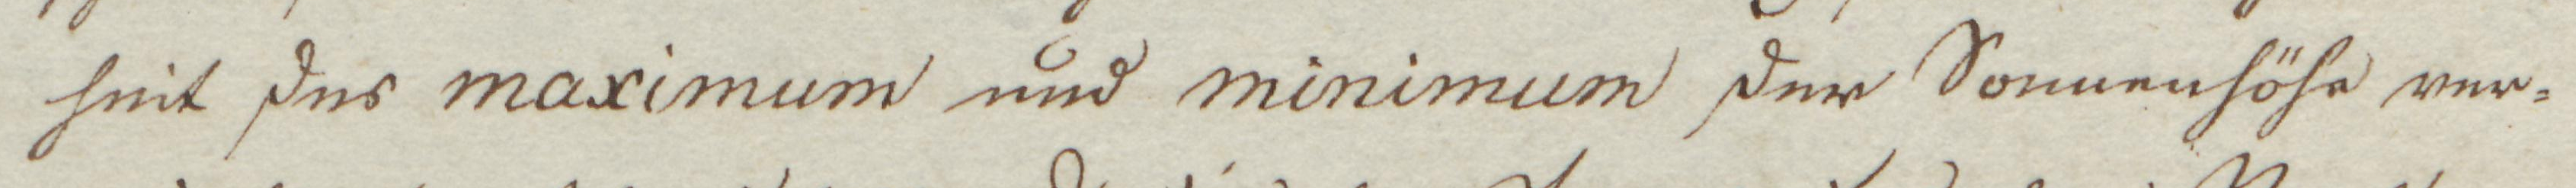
heit des maximum und minimum der Sönnenhöhe ver-
